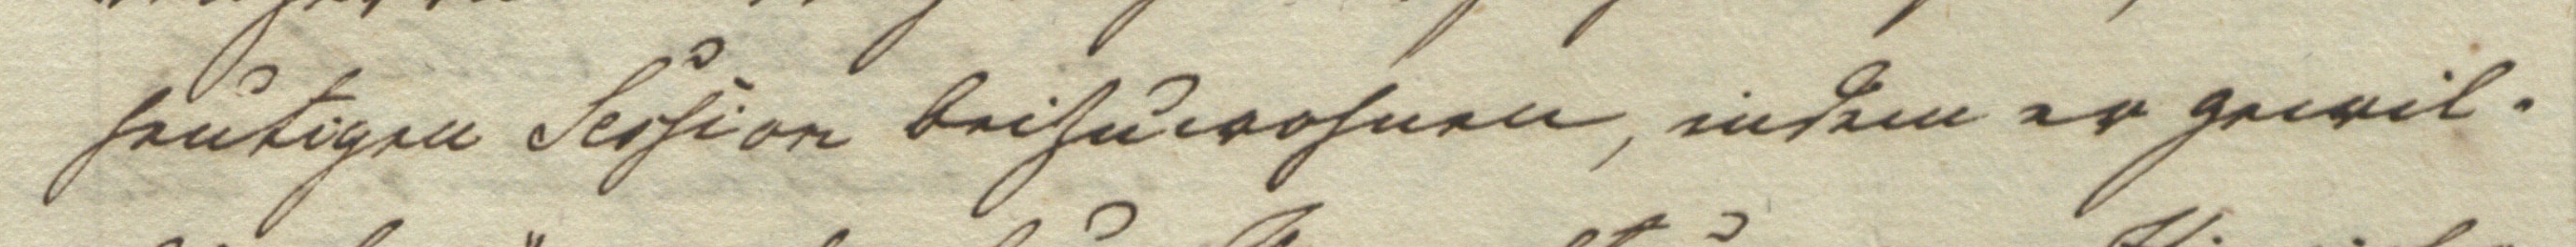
heutigen Session beizuwohnen, indem er gewil¬
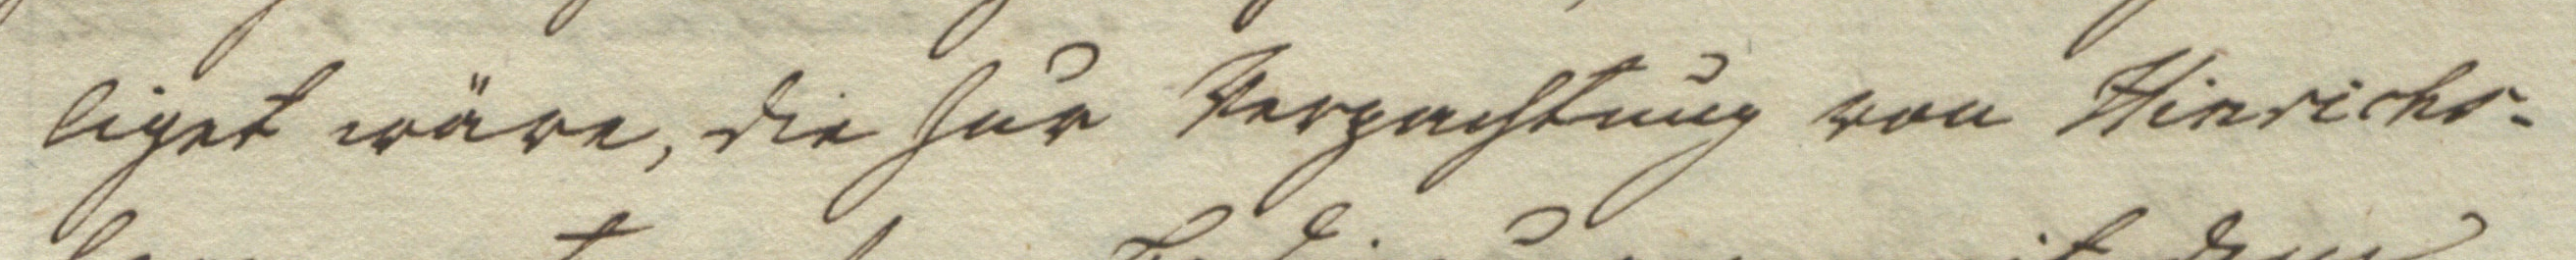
liget wäre, die zur Verpachtung von Hinrichs¬
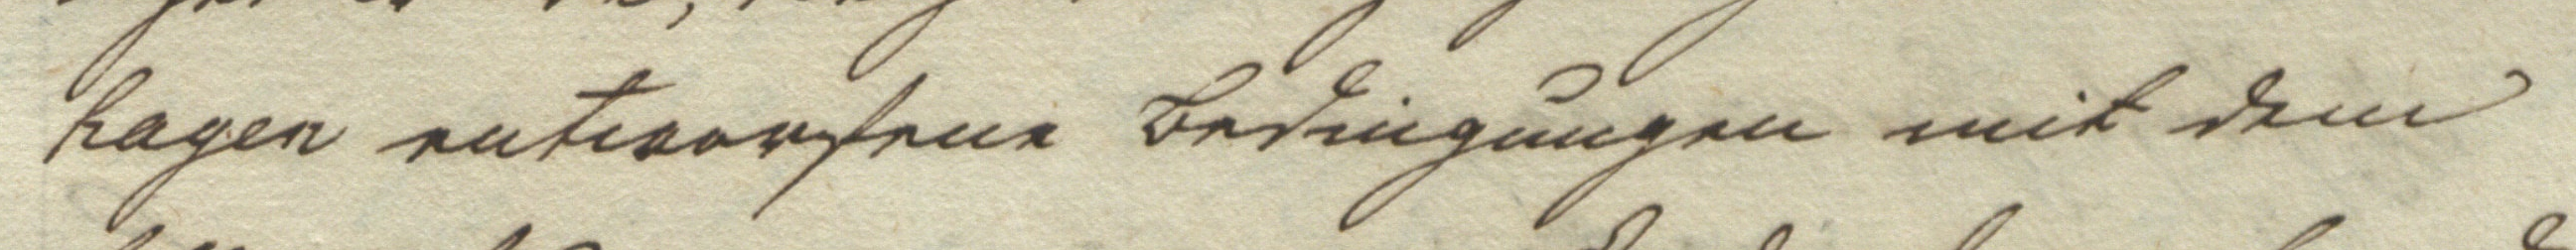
hagen entworfene Bedingungen mit dem
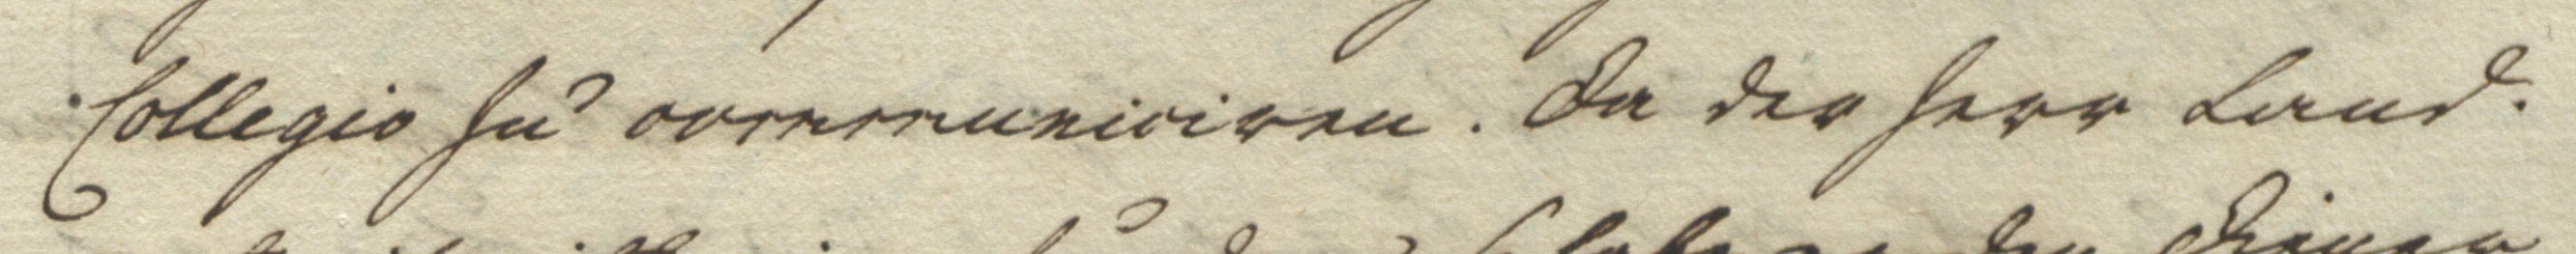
Collegio zu communiciren. Da der Herr Land¬
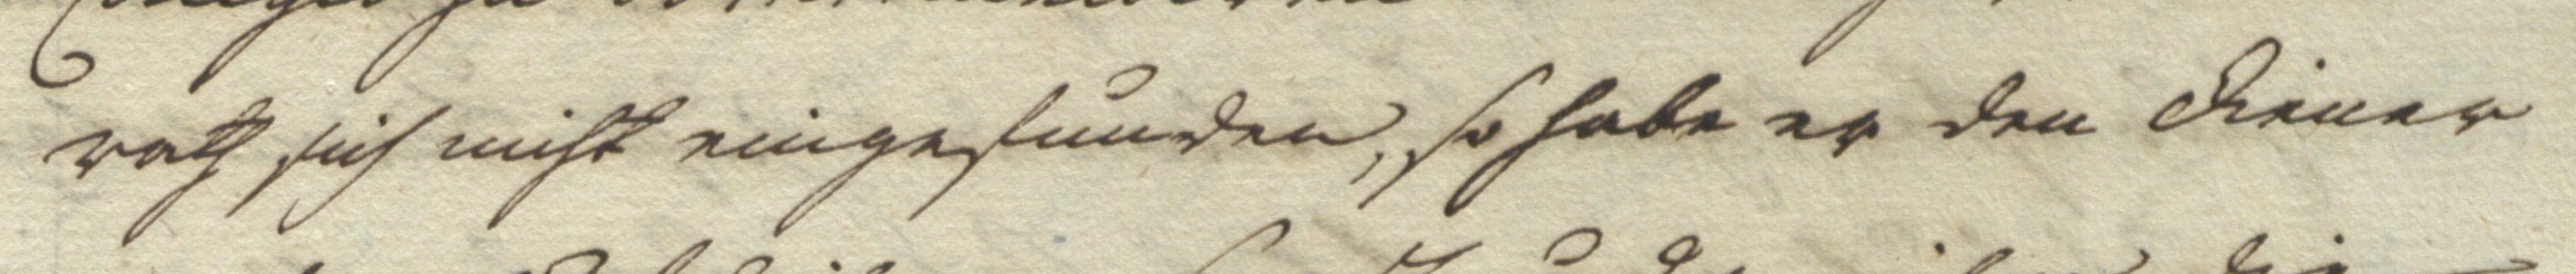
rath sich nicht eingefunden, so habe er den Diener
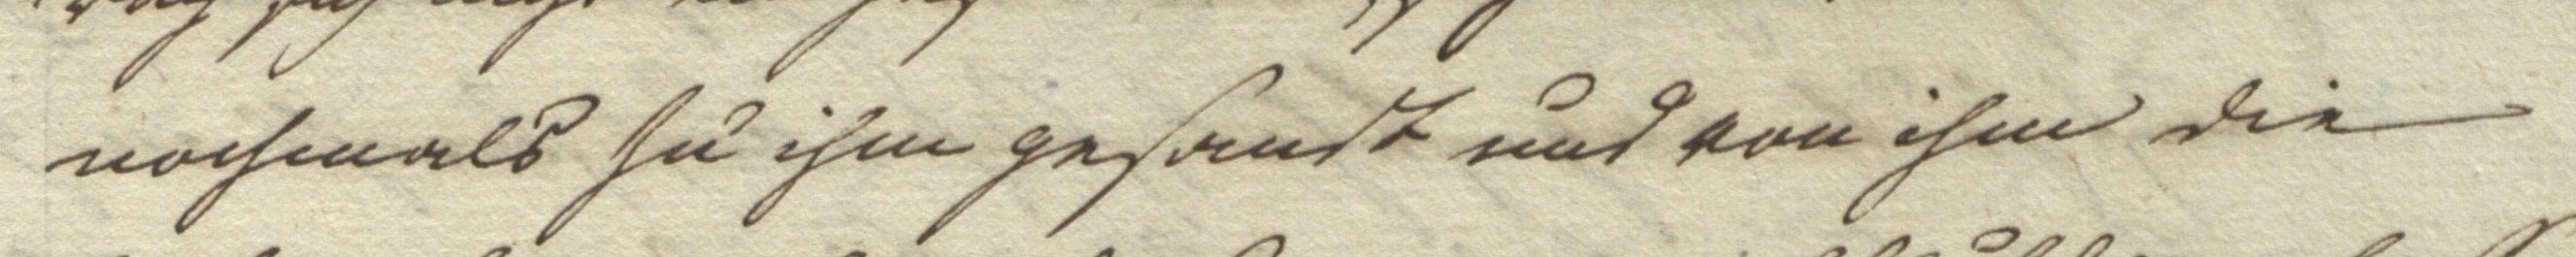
nochmals zu ihm gesandt und von ihm die
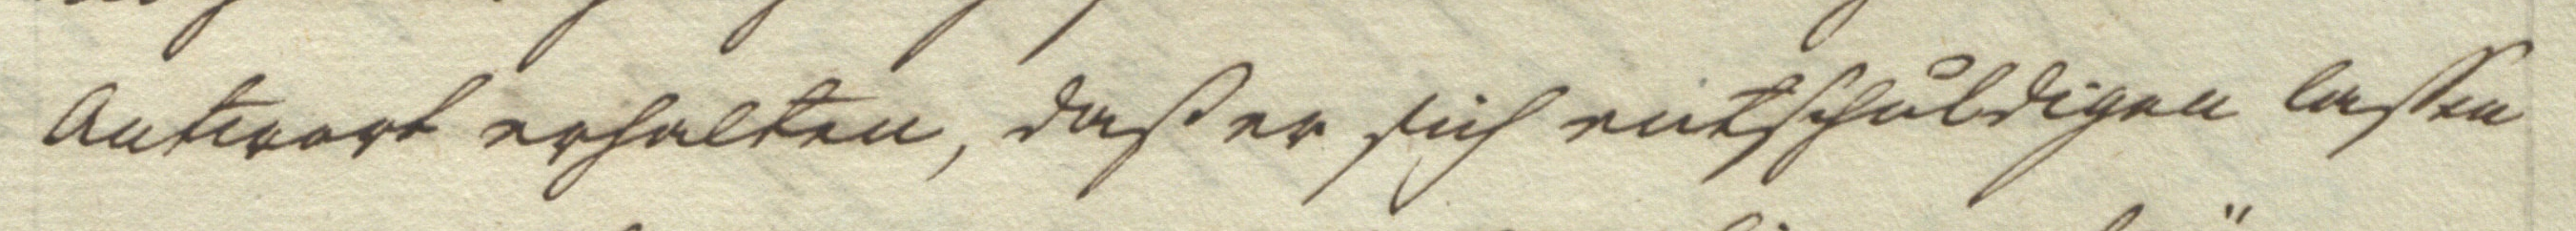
Antwort erhalten, daß er sich entschuldigen lassen
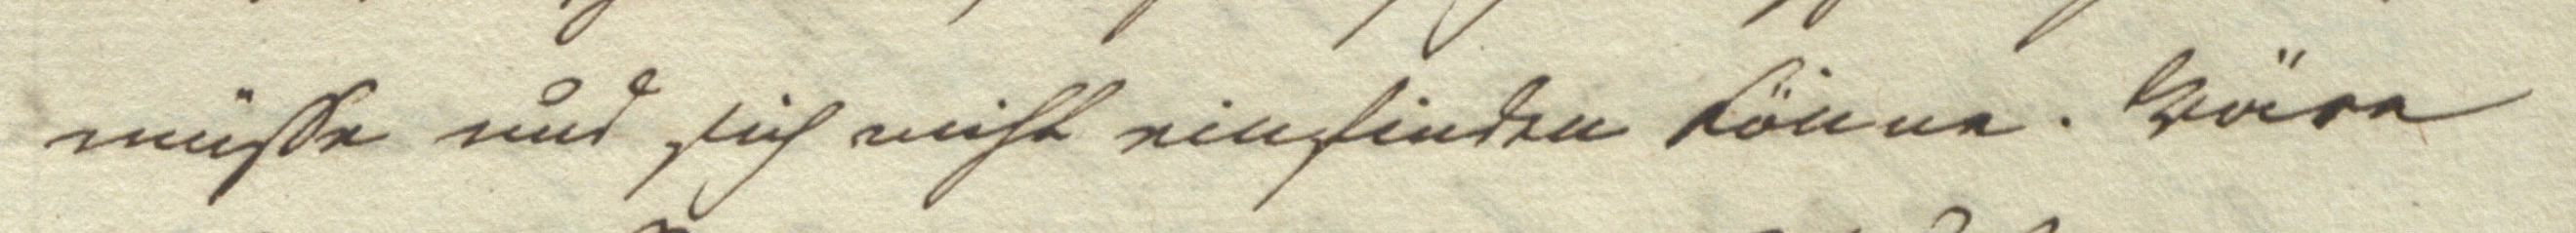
müsse und sich nicht einfinden könne. Wäre
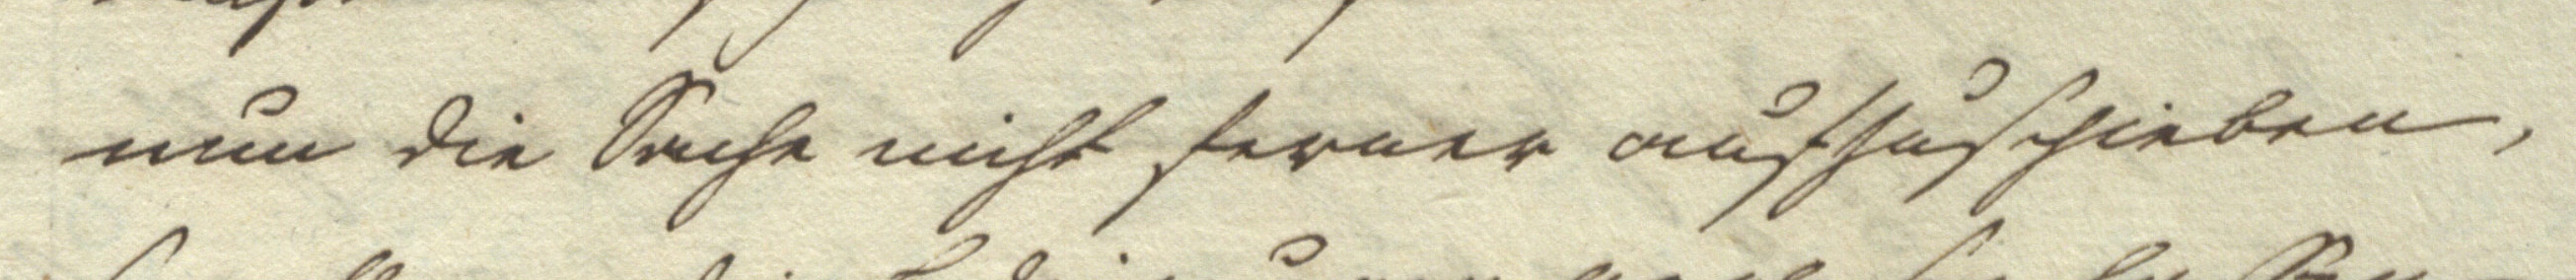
nun die Sache nicht ferner aufzuschieben,
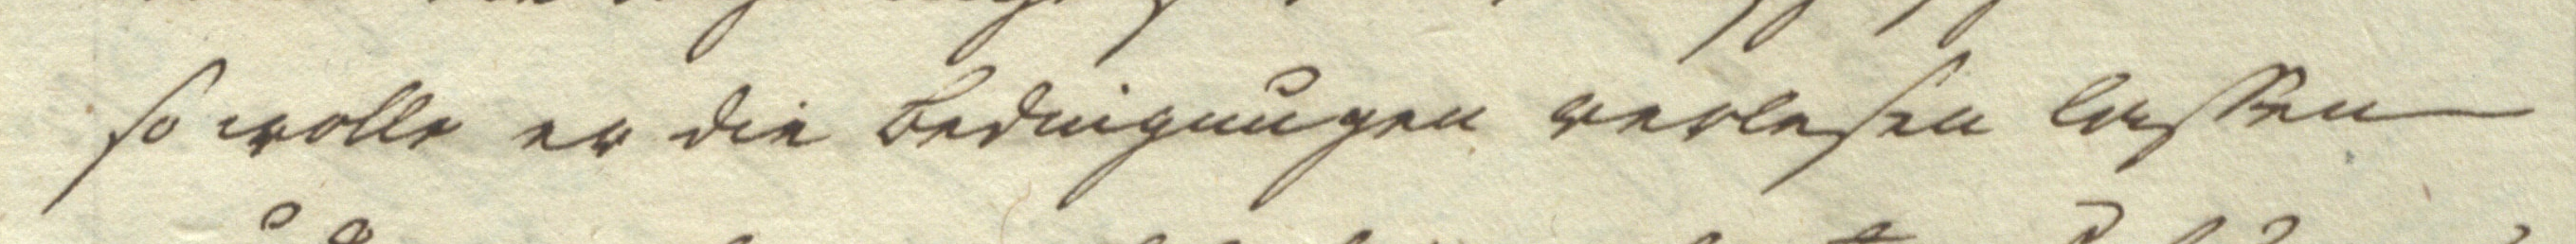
so wolle er die Bedingungen verlesen lassen
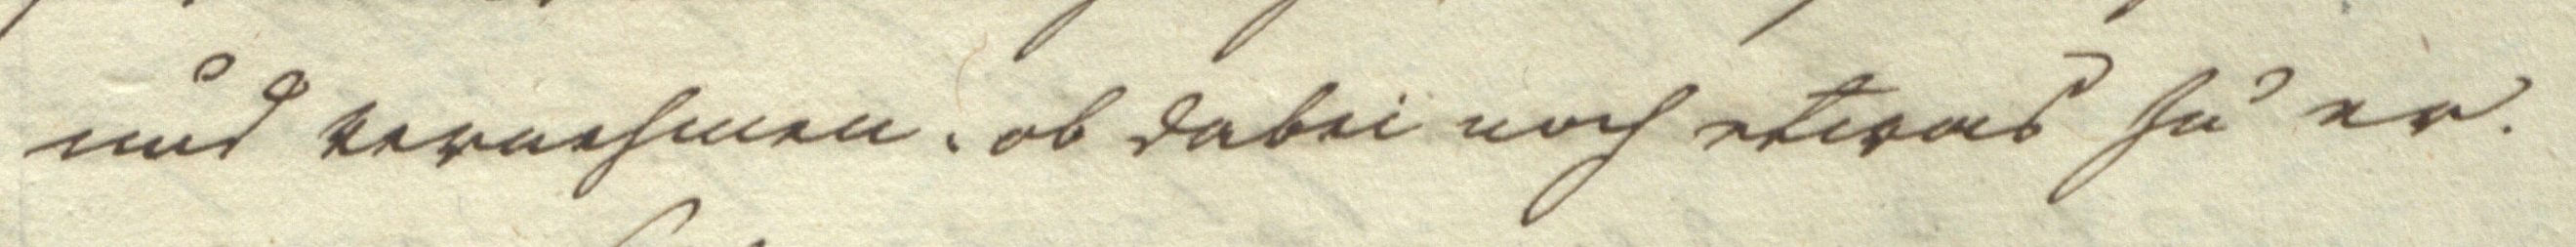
und vernehmen: ob dabei noch etwas zu er¬
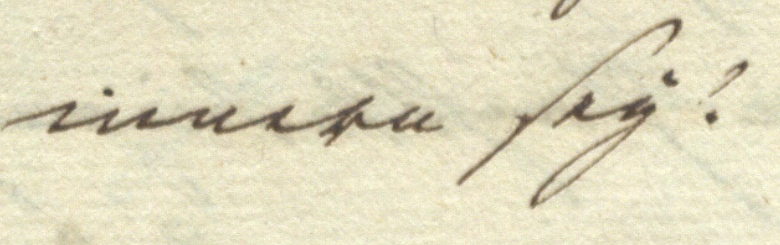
innern seÿ?
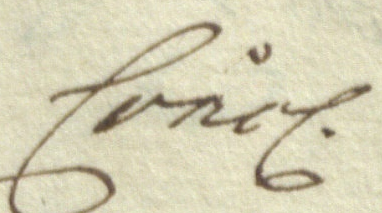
Concl.
